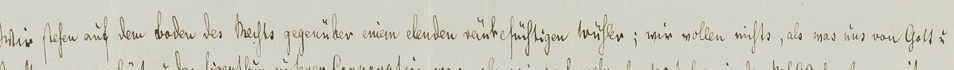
Wir stehen auf dem Boden des Rechts gegenüber einem elenden ränkesüchtigen Wühler; wir wollen nichts, als was uns von Gott u
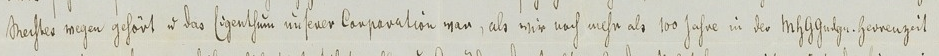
Rechtes wegen gehört u das Eigenthum unserer Corporation war, als wir noch mehr als 100 Jahre in der MHGGndgn. Herrenzeit
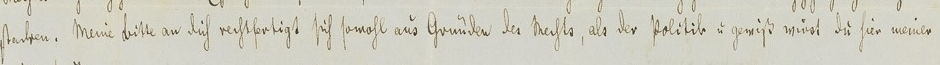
stacken. Meine Bitte an Dich rechtfertigt sich sowohl aus Gründen des Rechts, als der Politik u gewiß wirst Du hier meiner
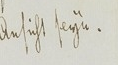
Ansicht seyn.
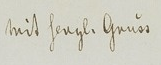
Mit herzl. Gruss
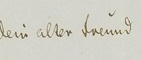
Dein alter Freund
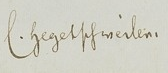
E. Hegetschweiler.
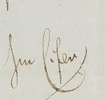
Im Eifer
